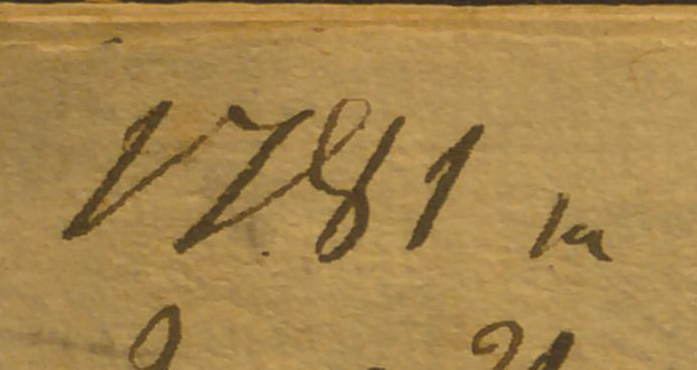1781
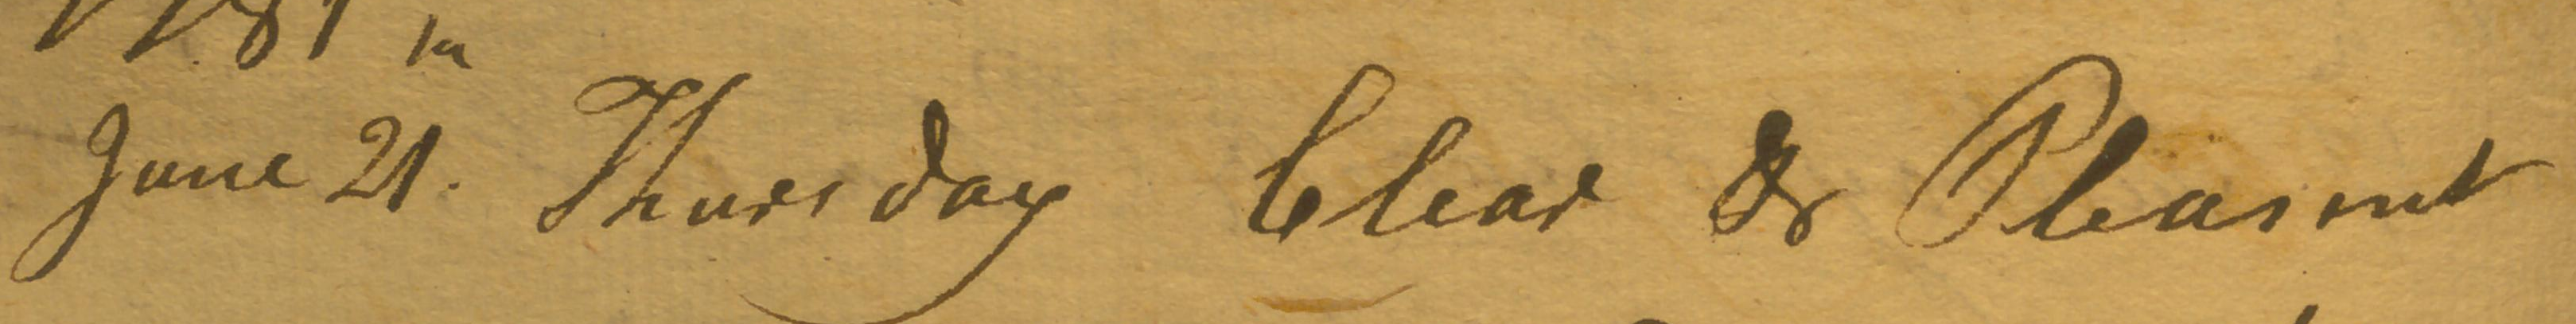June 21^th. Thursday Clear & Pleasent
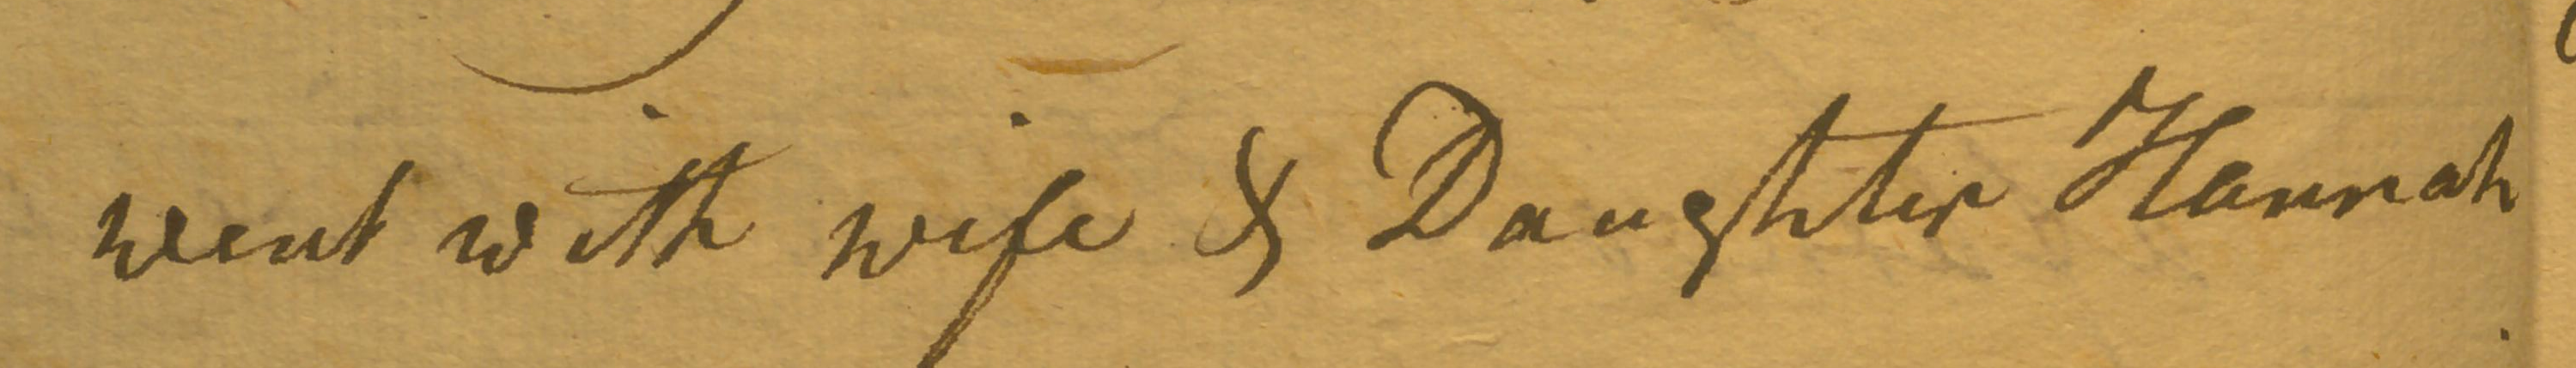went with wife & Daughter Hannah
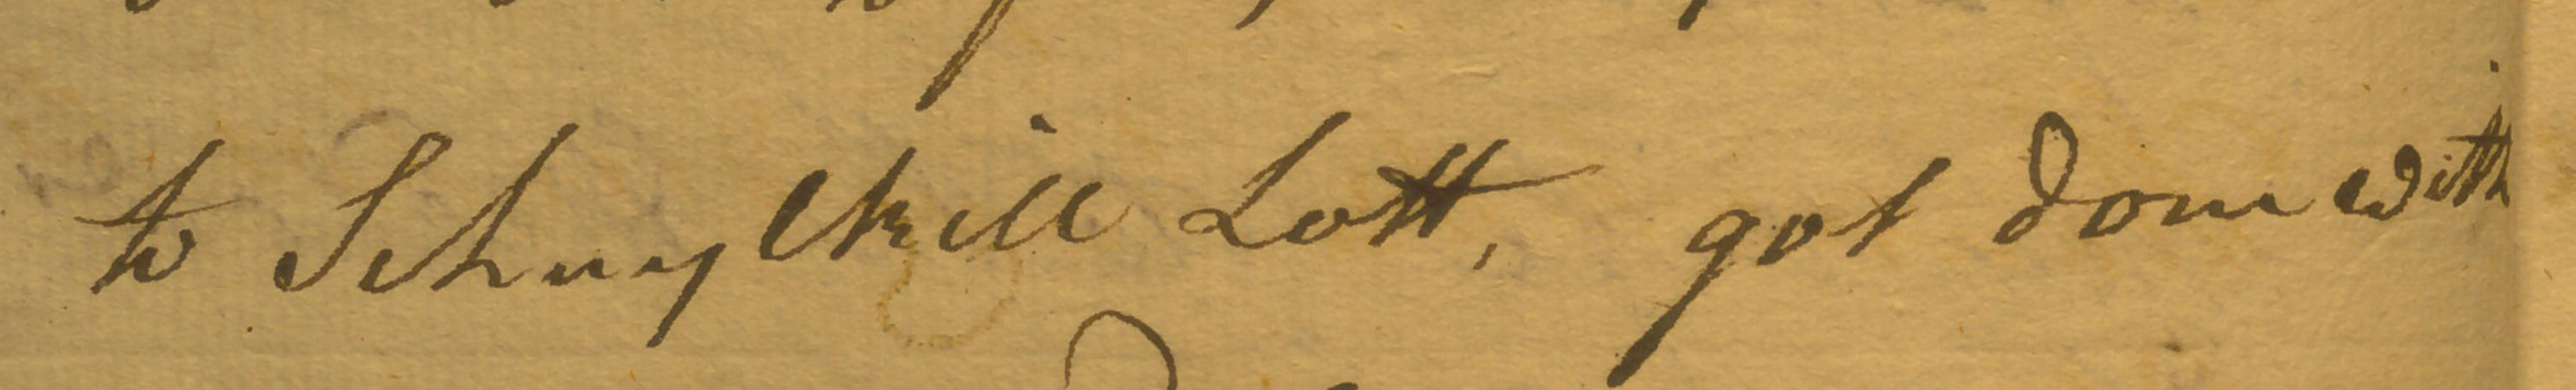to Schuylkill Lott, got done with
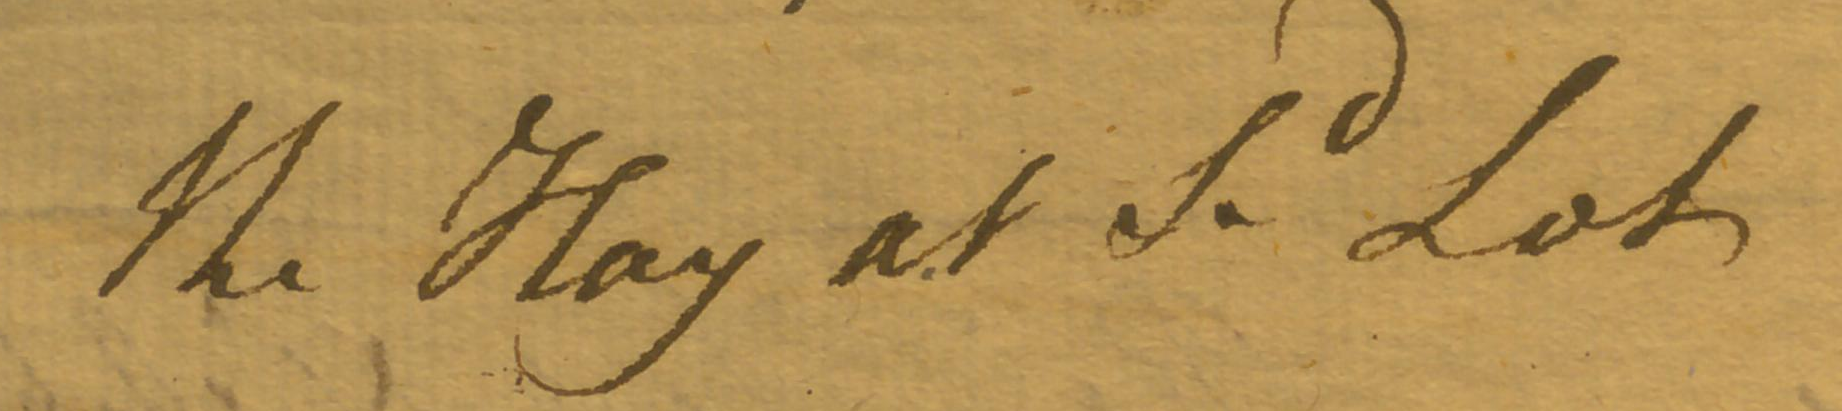The Hay at s^d. Lot
